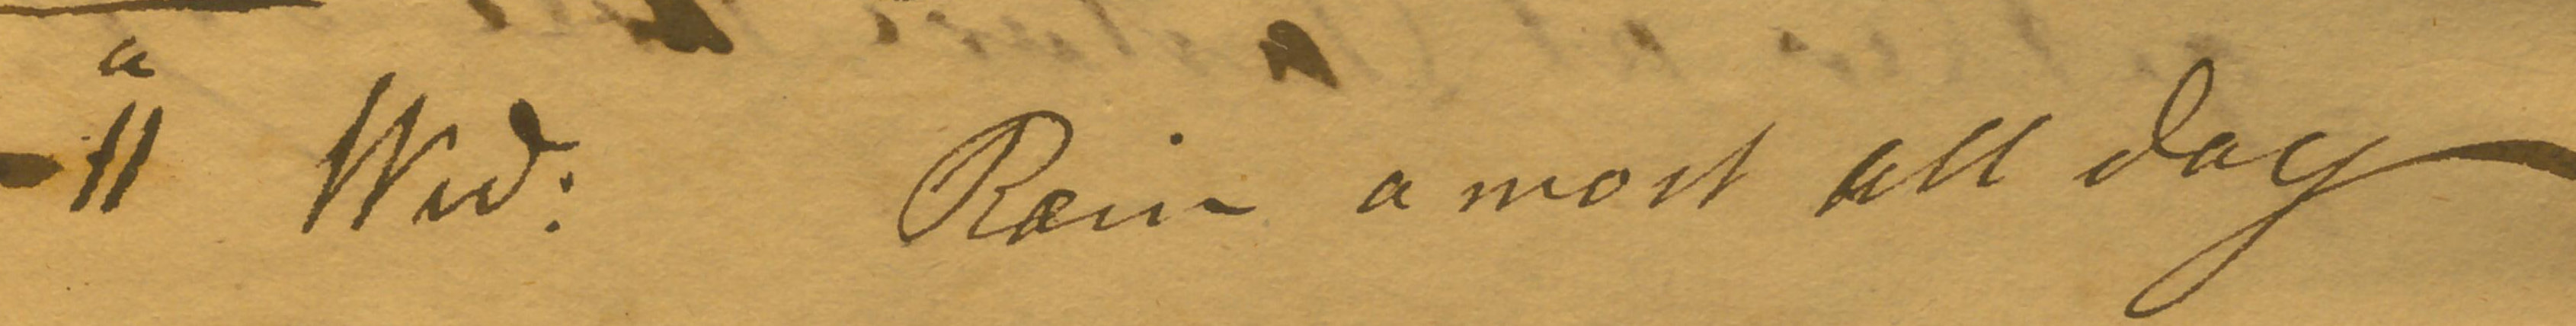11 Wed. Rain a most all day
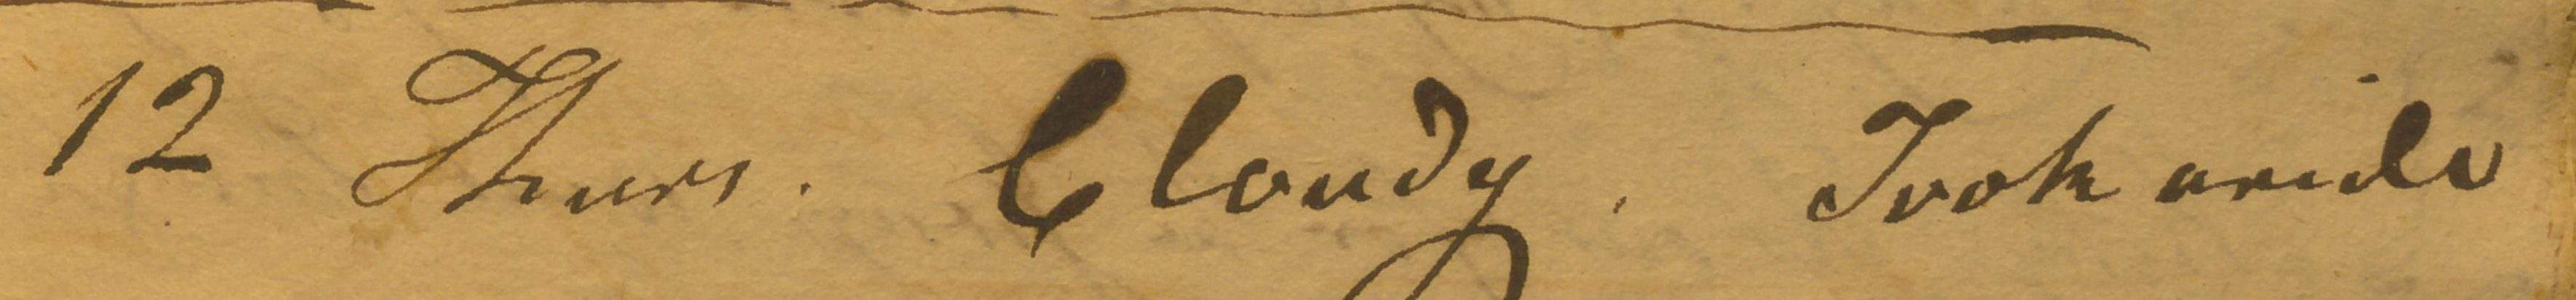12 Thurs. Cloudy. Took a ride
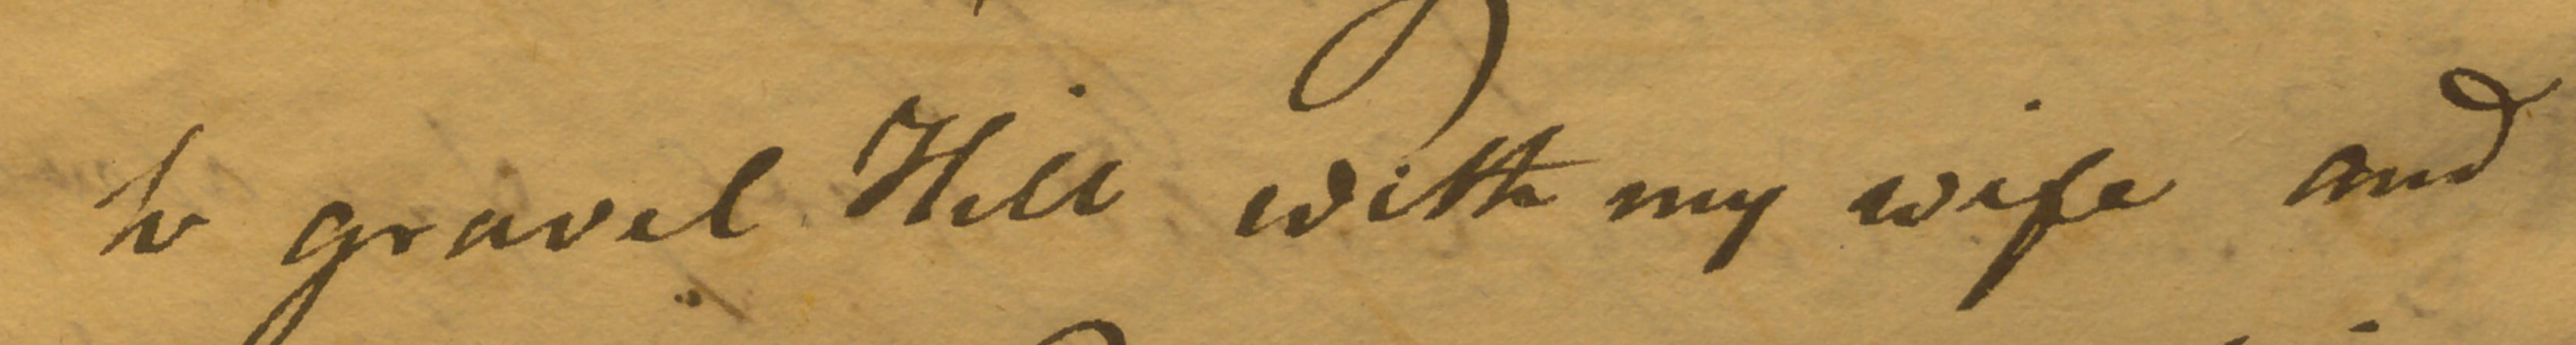w gravel Hill with my wife and
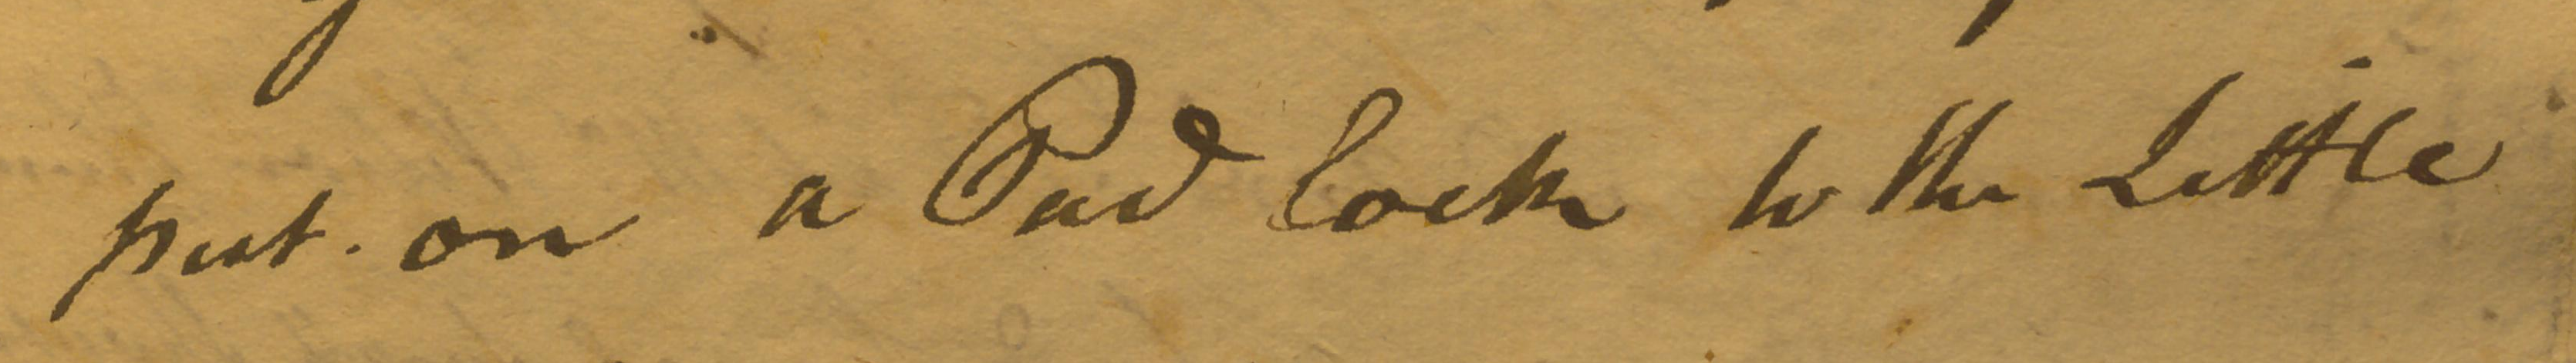pet. on a Padlock to the Little
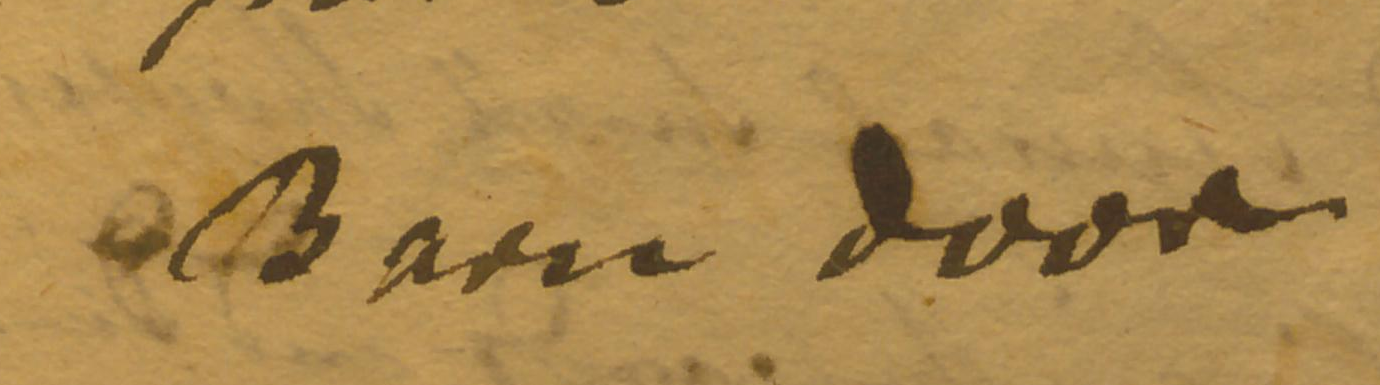Barn door
